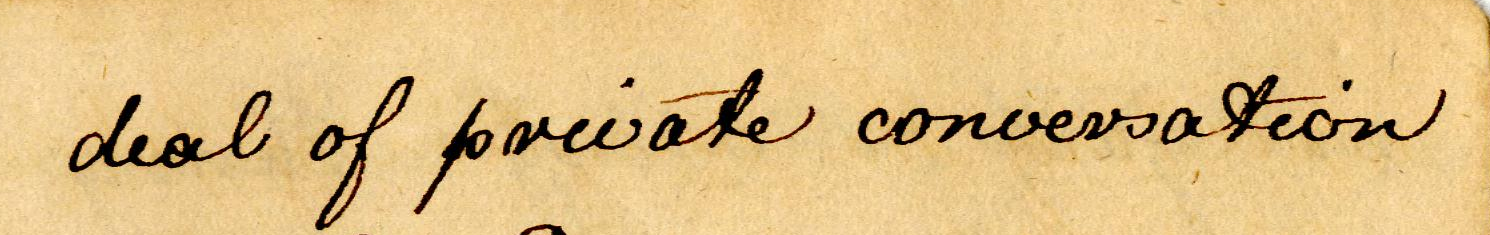deal of private conversation
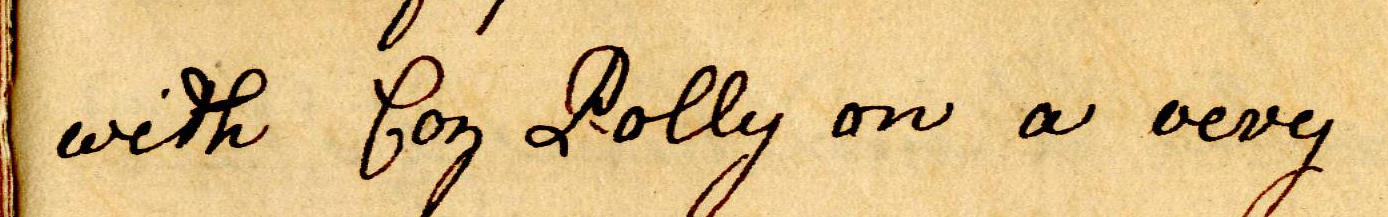with Coz Polly on a very
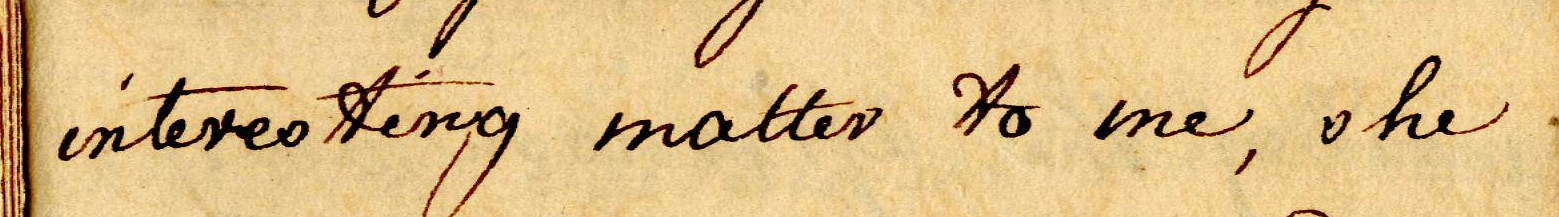interesting matter to me, she
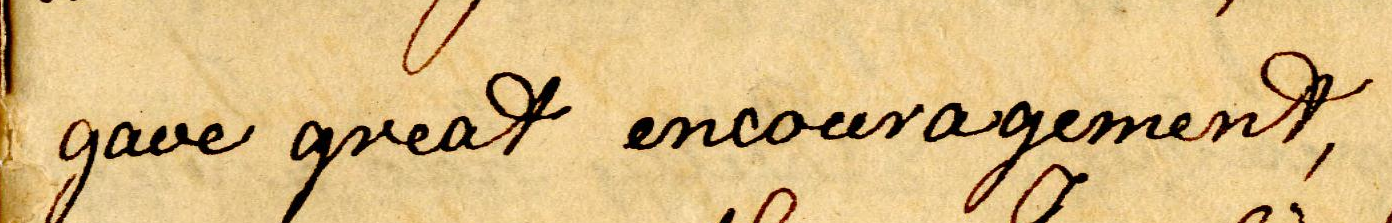gave great encouragement,
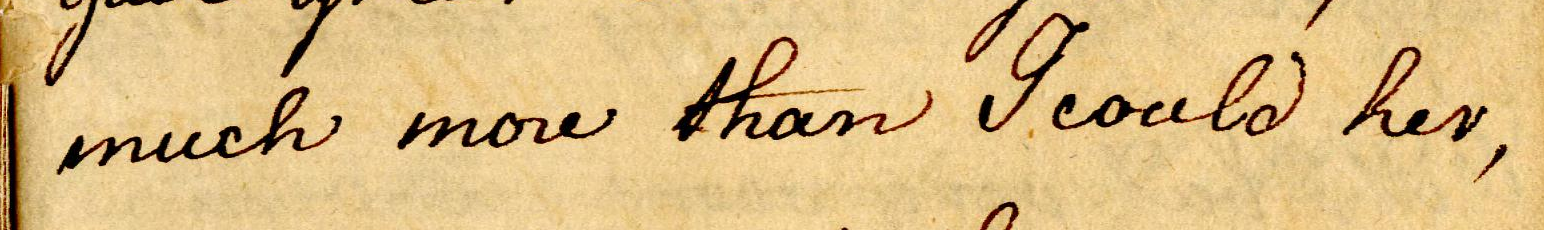much more than I could her,
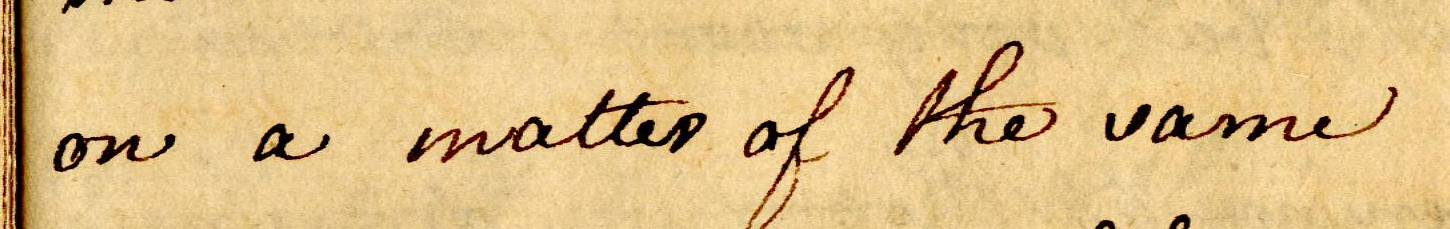on a matter of the same
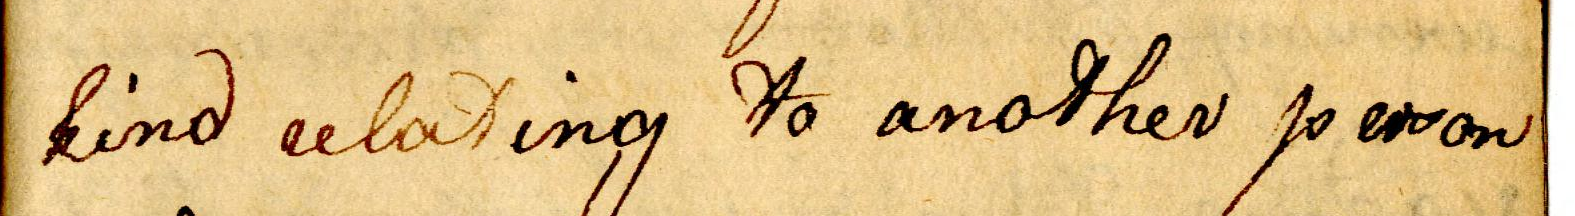kind relating to another person
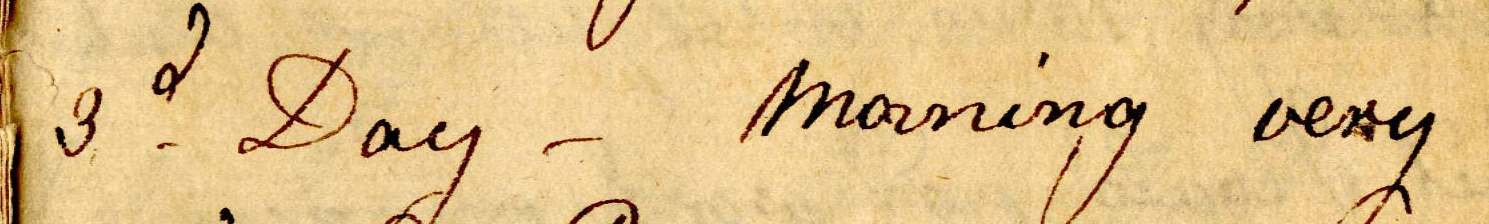3^th Day- Morning very
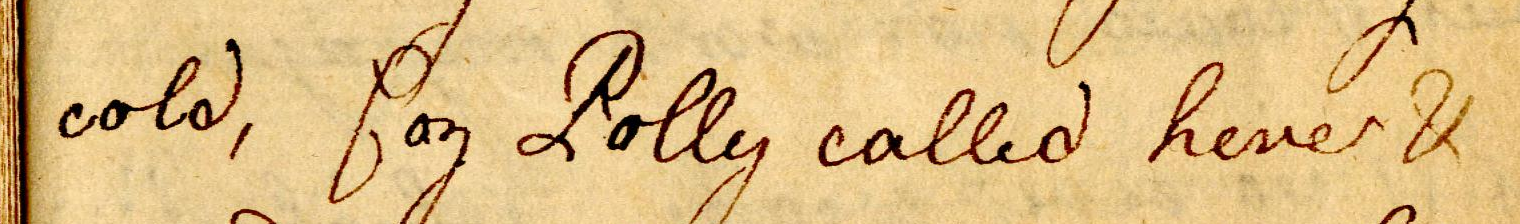cold, Coz Polly called here &
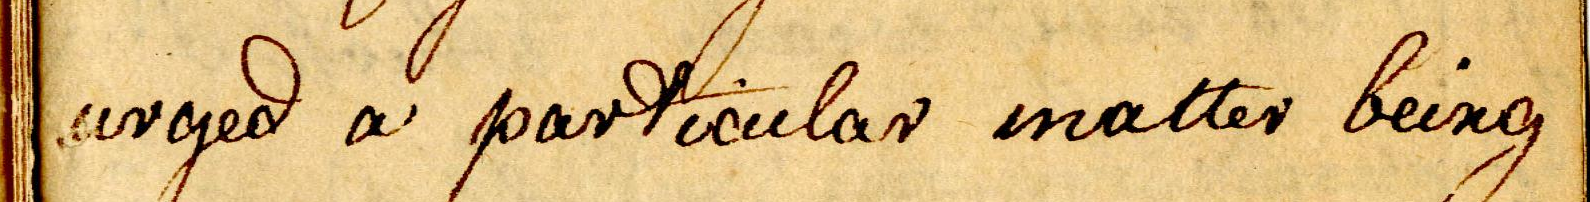urged a particular matter being
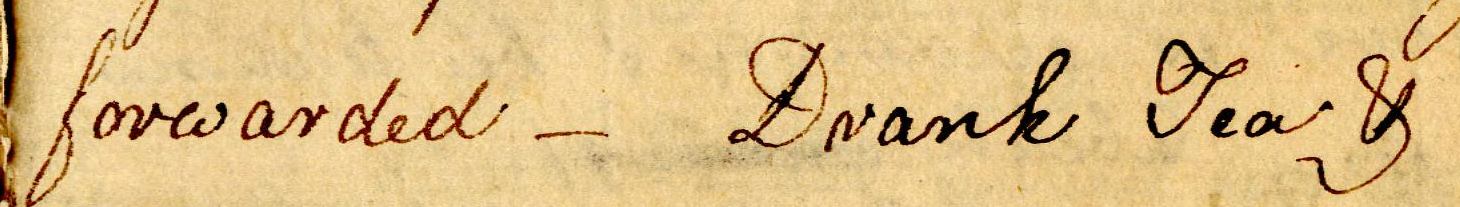forwarded- Drank Tea &
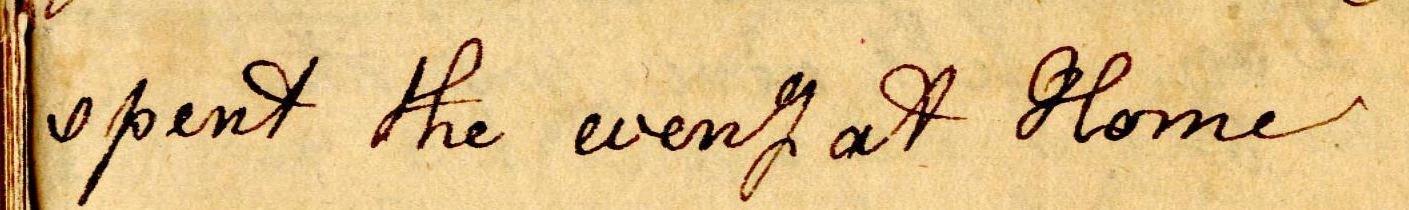spent the even^g at Home
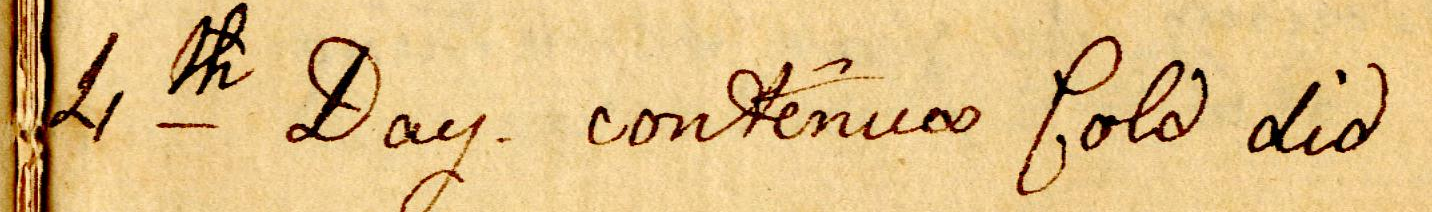4^th- Day. continues Cold did
